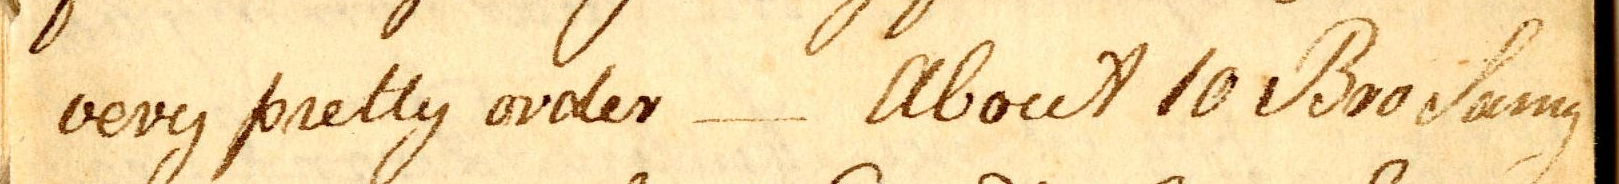very pretty order- About 10 Bro Samy
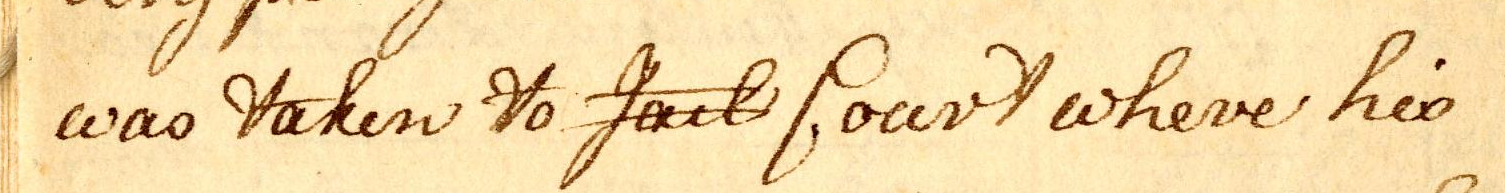was taken to [Jail] Court where his
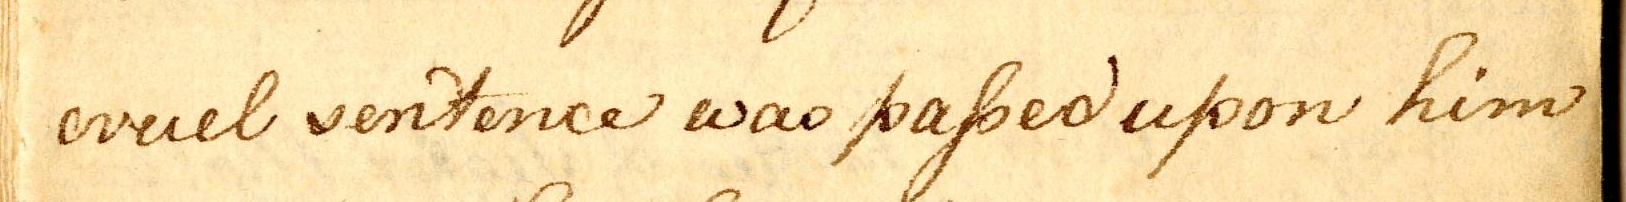cruel sentence was passed upon him
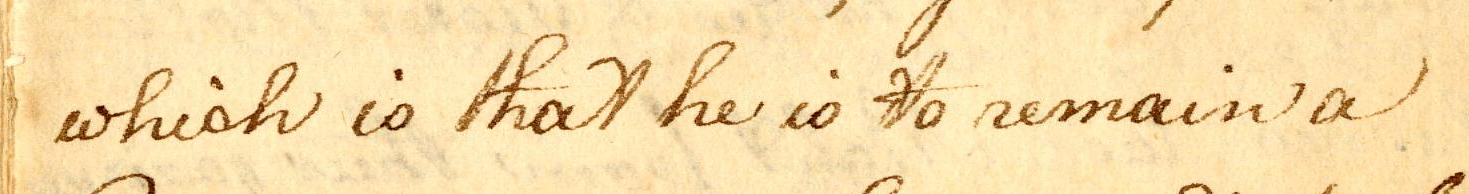which is that he is to remain a
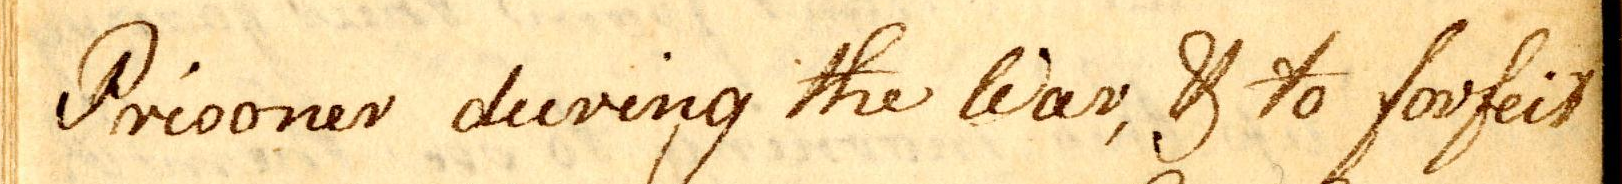Prisoner during the War, & to forfeit
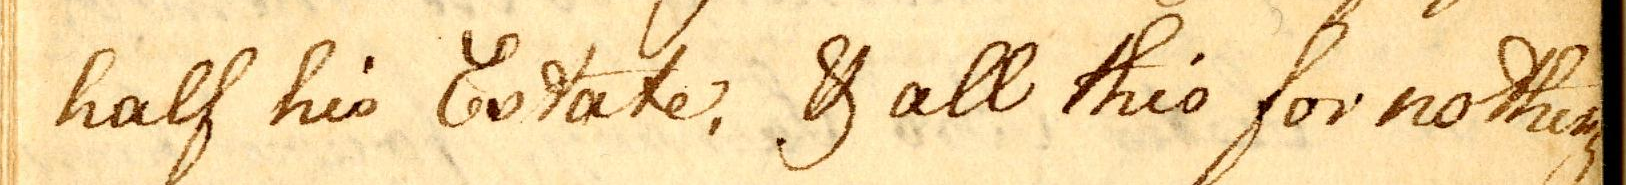half of his Estate, & all this for nothing
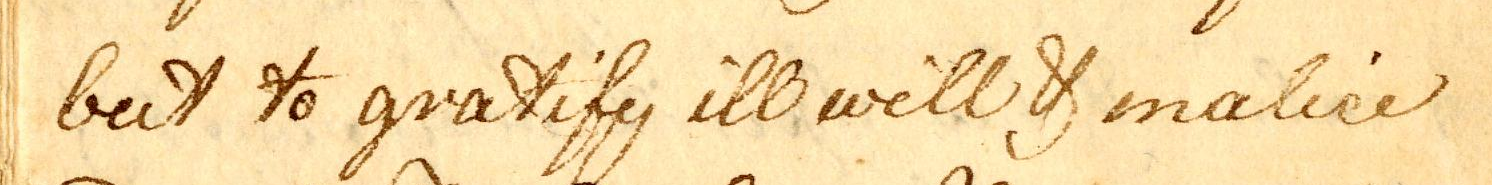but to gratify ill will & malice
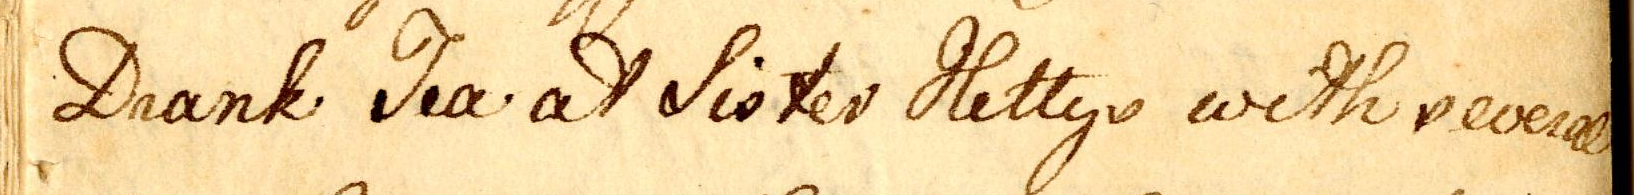Drank Tea at Sister Hettys with several
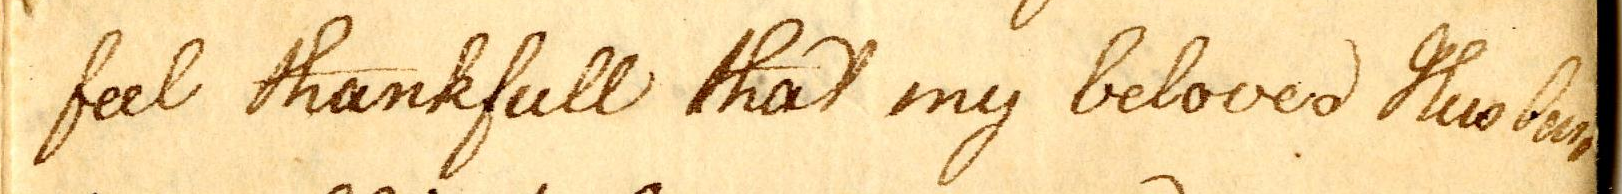feel thankfull that my beloved Husban[d]
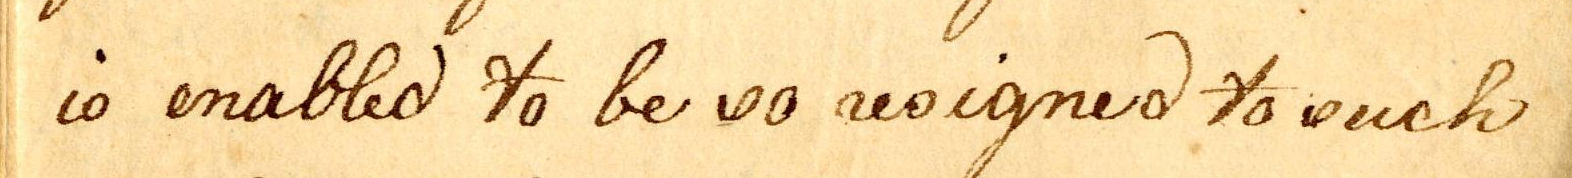is enabled to be so resigned to such
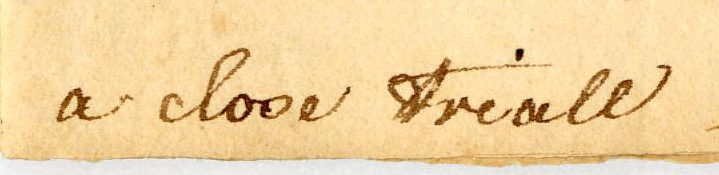a close triall
